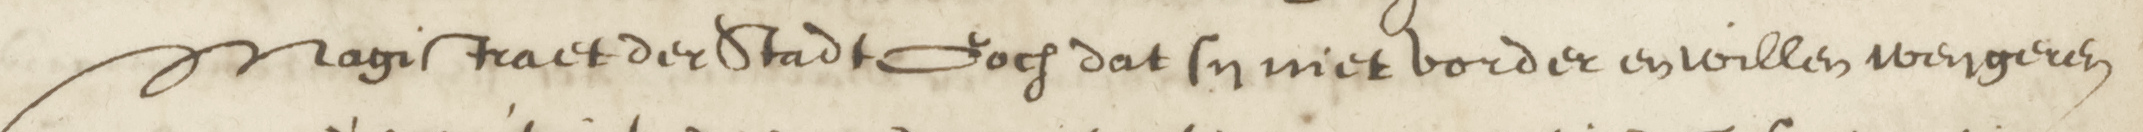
Magistaet der Stadt Goch dat sy niet vorder en willen weygeren
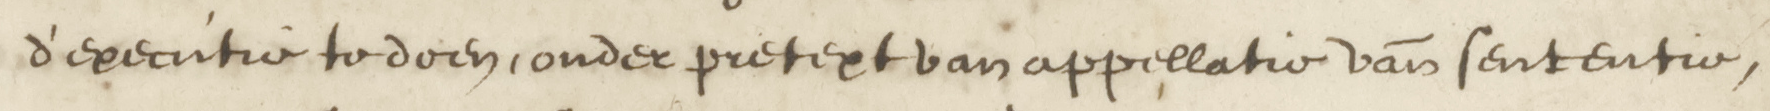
d'executie te doen, onder pretext van appellatie van sententie,
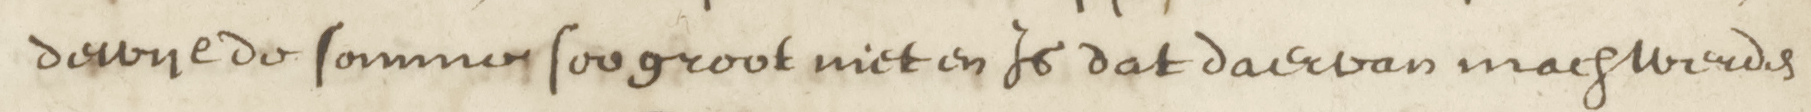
dewyl de somme soo groot niet en Is dat daervan mach werden
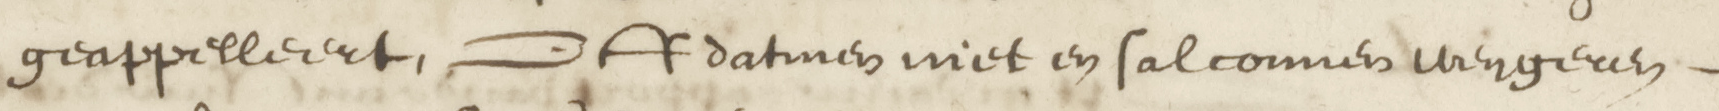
geappelleert. Off dat men niet en sal connen weygeren -
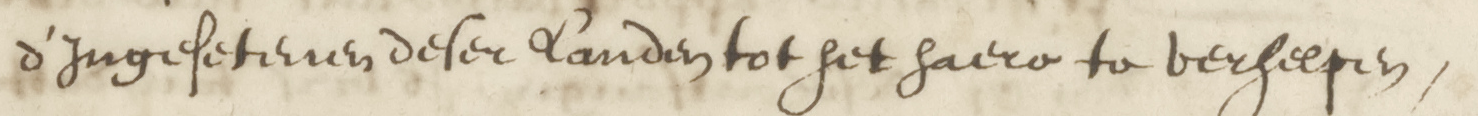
d'Ingesetenen deser Landen tot het haere te verhelpen.
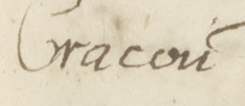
Cracou
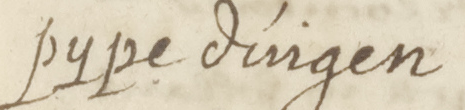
pype duigen
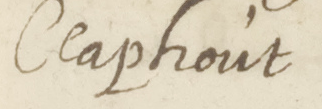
Claphout
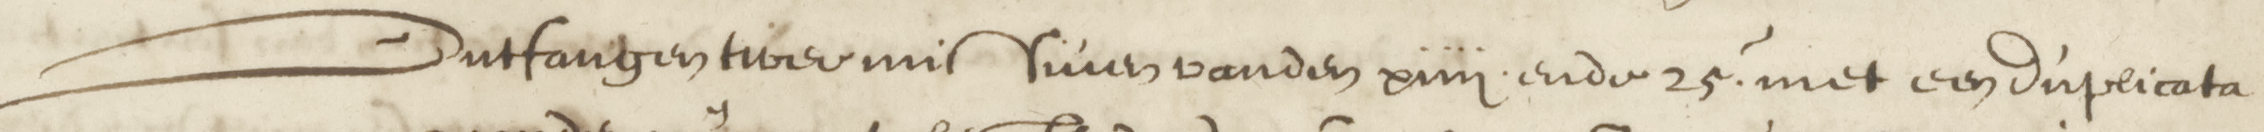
Ontfangen twee missiuen vanden xiiii. ende 25e. met een duplicata
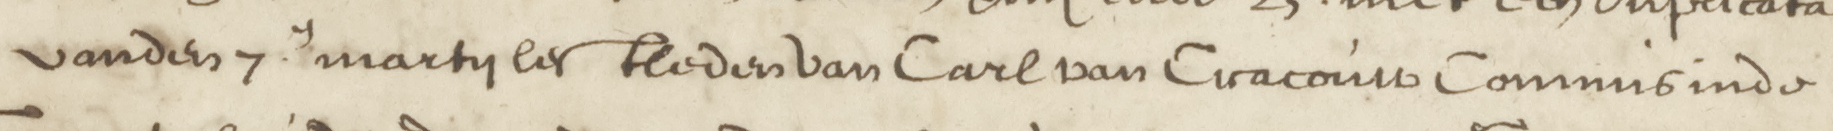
vanden 7e marty lestleden van Carl van Cracouw Commis inde
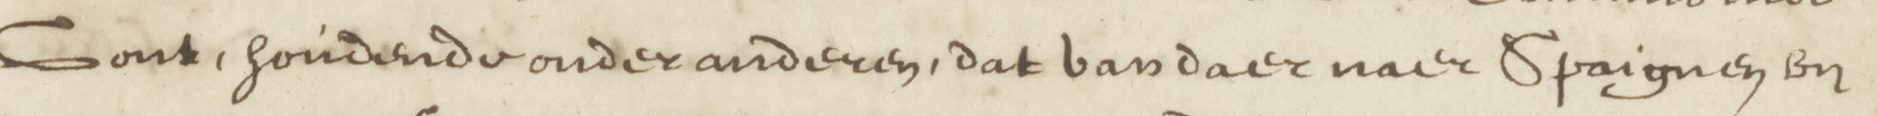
Sont, houdende onder anderen, dat van daer naer Spaignen by
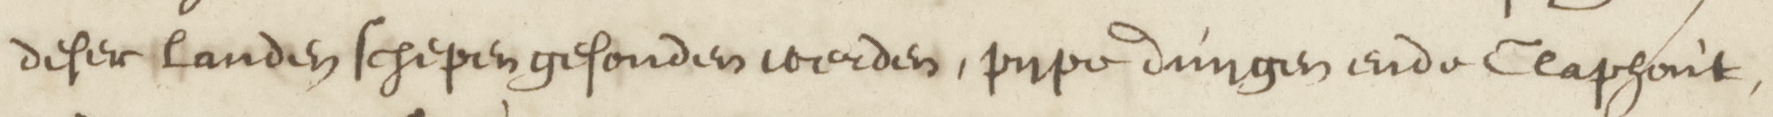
deser landen schepen gesonden werden, pype duygen ende Claphout,
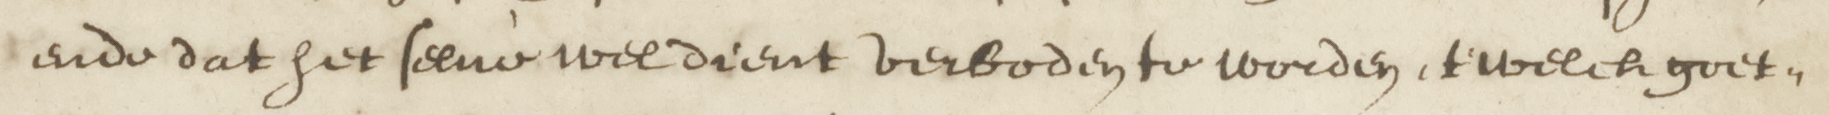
ende dat het selue wel dient verboden te worden, t'welck goet„
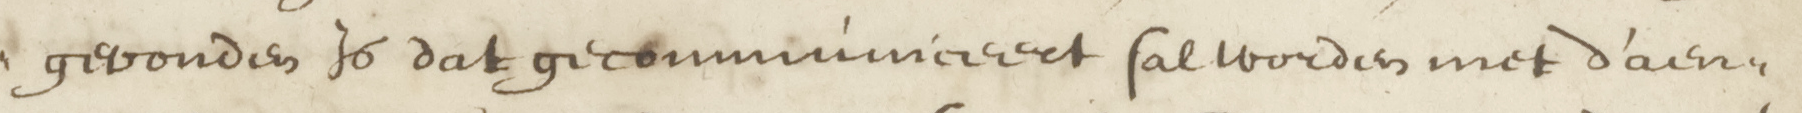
„gevonden Is dat gecommuniceert sal worden met d'aen„
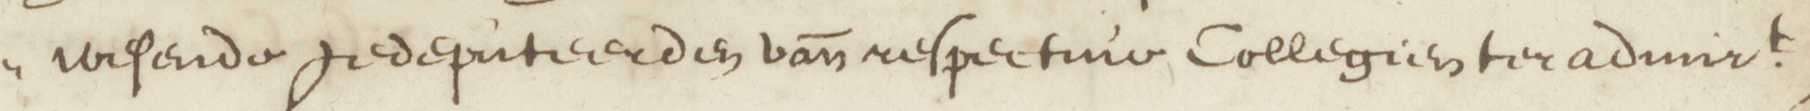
„wesende gedeputeerden van respectiue Collegien ter admirt.
